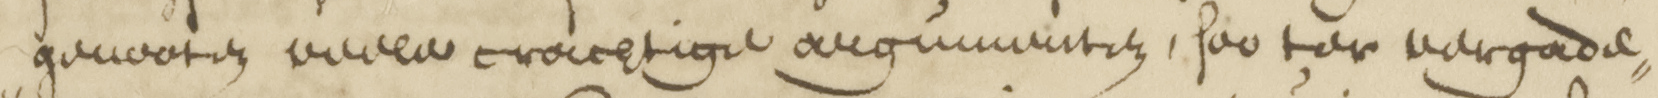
,,genooten veele crachtige argumenten, soo ter vergade„
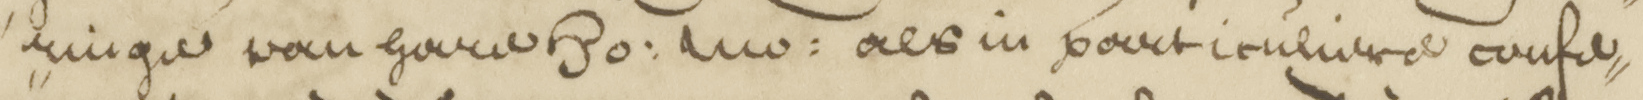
ringe van hare Ho:Mo: als in particulliere confe„
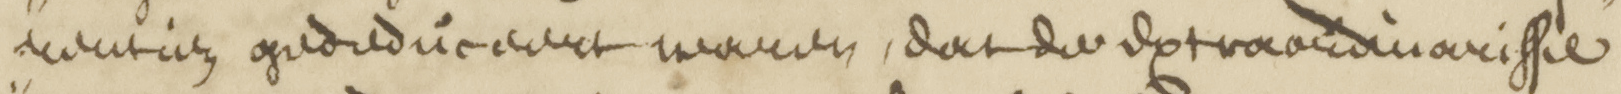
rentien gededuceert waren, dat de extraordinarisse
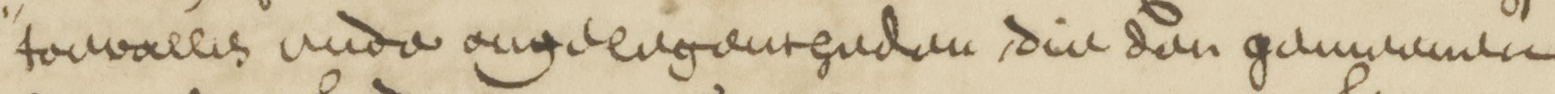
toevallen ende ongelegentheden, die den gemeenen
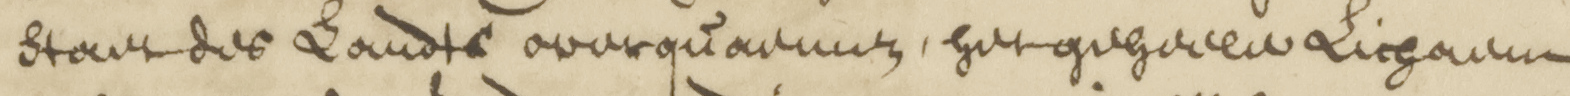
staet des Landts overquaemen, het geheele Lichaem
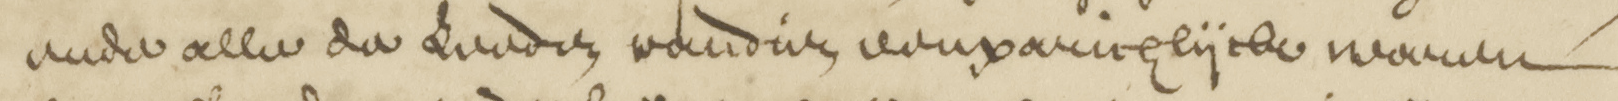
ende alle de quaden vandien eenparichlijck waren
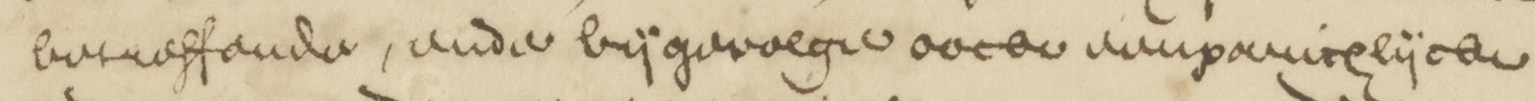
betreffende, ende bijgevolge oock eenparichlijck
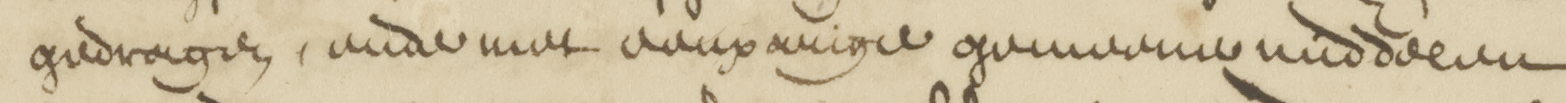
gedragen, ende met eenparige gemeene middelen
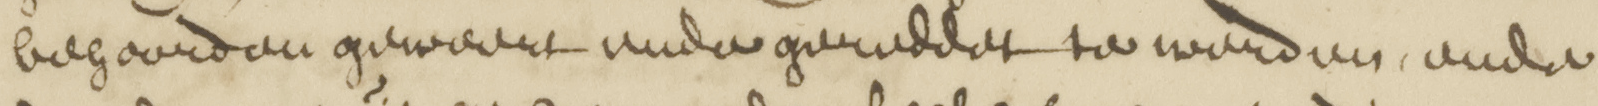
behoorden geweert ende gereddet te werden, ende
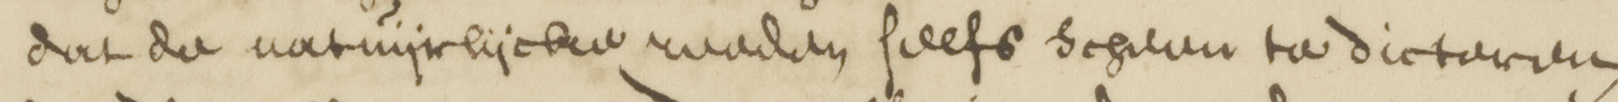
dat de natuijrlijcke reeden selfs scheen te dicteren
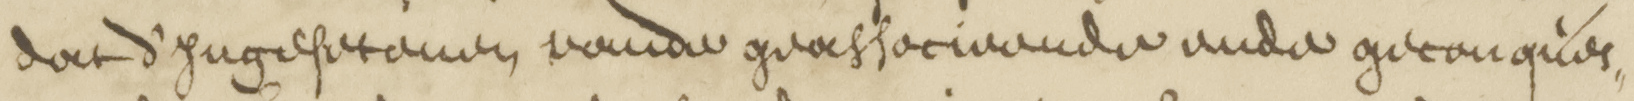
dat d'Ingesetenen vande geassocieerde ende geconques„
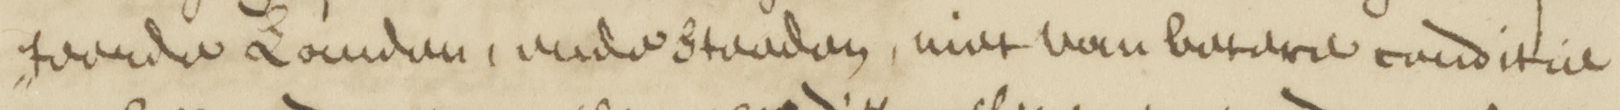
teerde Landen, ende Steeden, niet van betere conditie
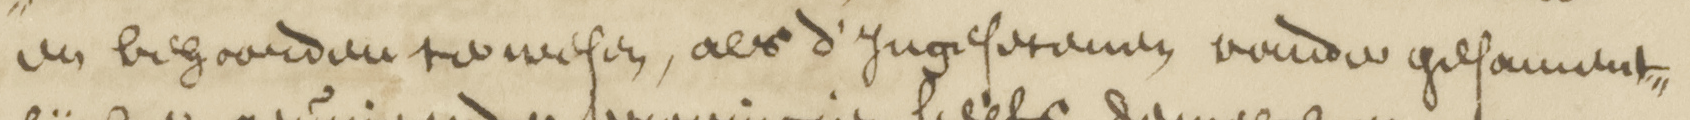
en behoorden te wesen, als d'Ingesetenen vande gesament„
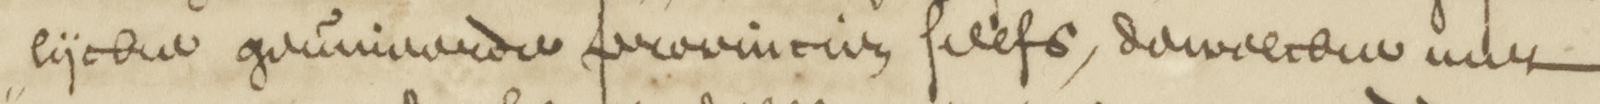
,,lijcke geunieerde provincien selfs, dewelcke met
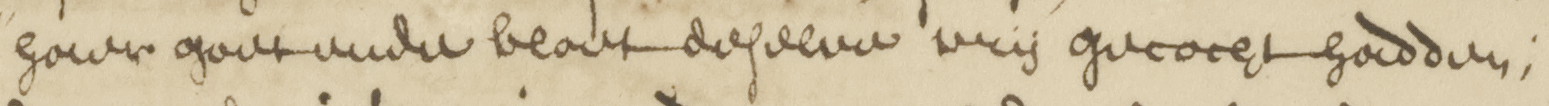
haer goet ende bloet deselve vrij gecocht hadden;
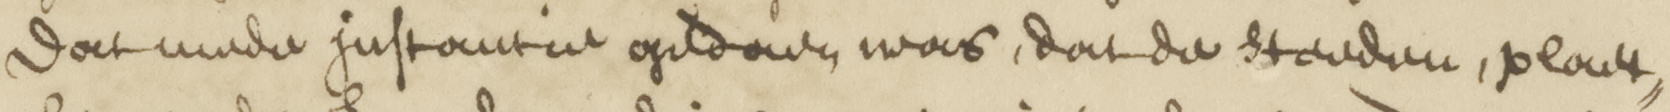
Dat mede instantie gedaen was, dat de steeden, plaet„
